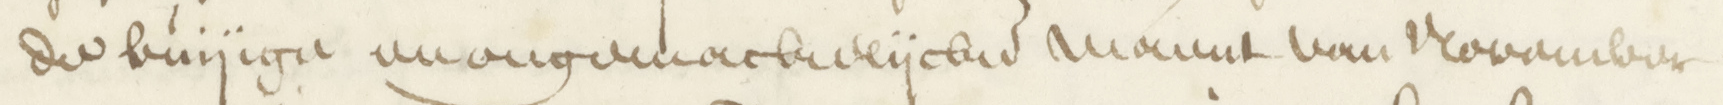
de buijige en ongemackelijcke maent van November
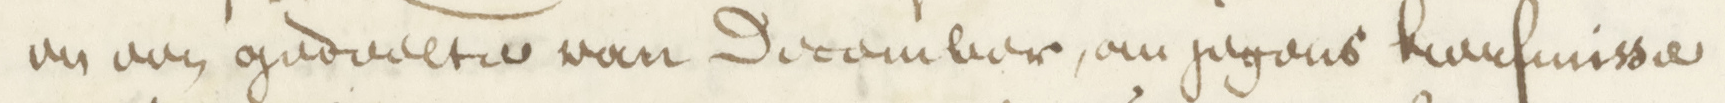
en een gedeelte van December, om jegens kersmisse
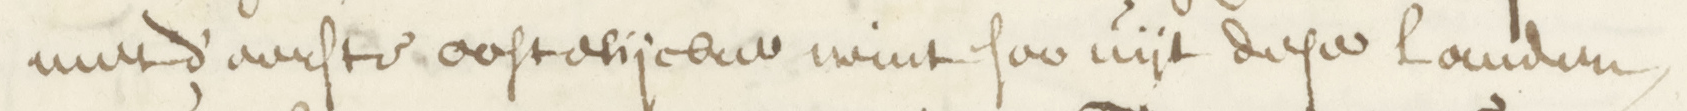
met d'eerste oostelijcke wint soo uijt dese Landen,
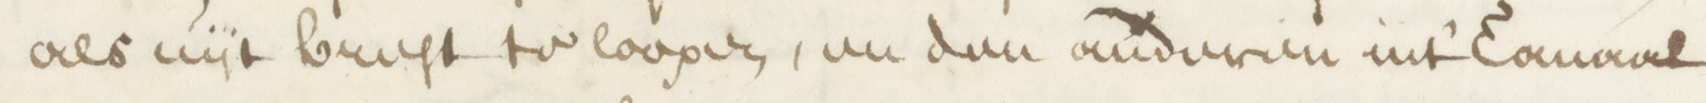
als uijt brest te loopen, en dan anderen int'Canaal
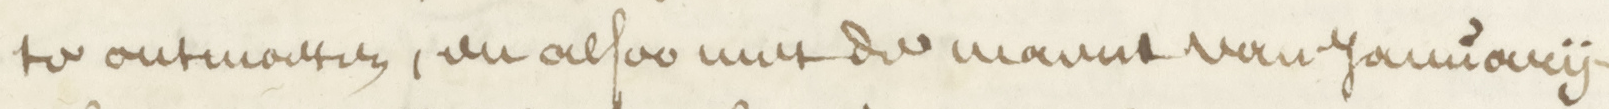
te ontmoeten, en alsoo met de maent van Januarij —
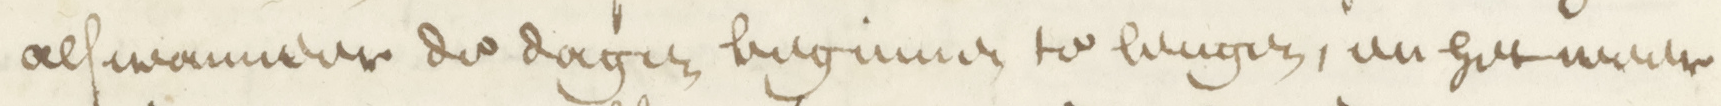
als wanneer de dagen beginnen te lengen, en het weer
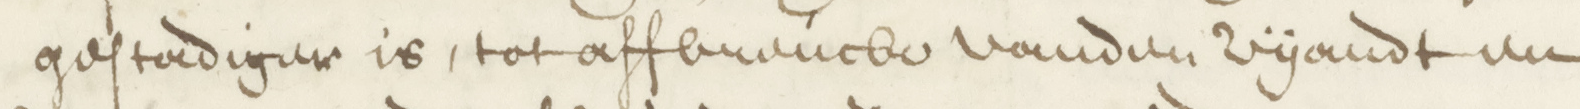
gestadiger is, tot affbreuck vanden vijandt en
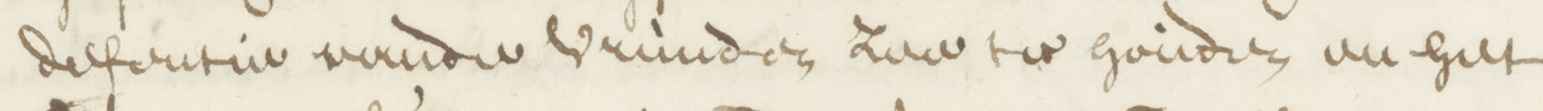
defentie vande Vrunden zee te houden, en het
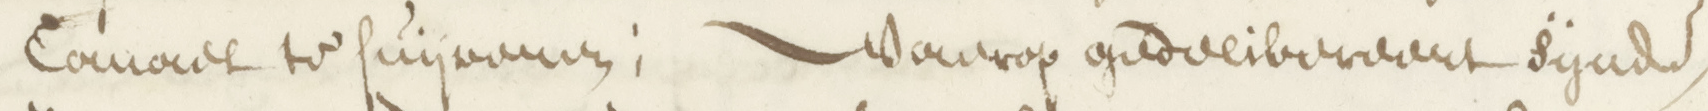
Canael te suijveren: Waerop gedelibereert sijnde,
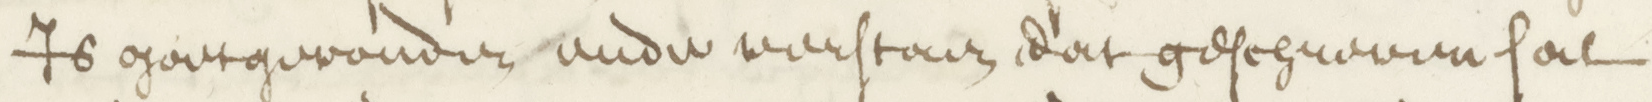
Is goetgevonden ende verstaen, dat geschreven sal
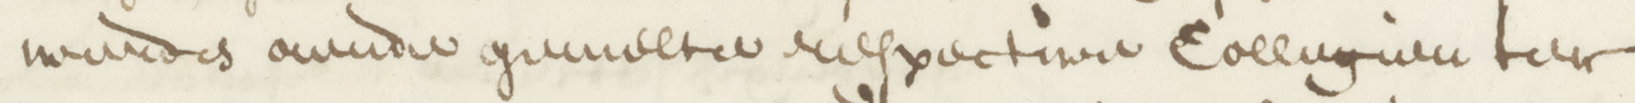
werden aende gemelte respective Collegien ter
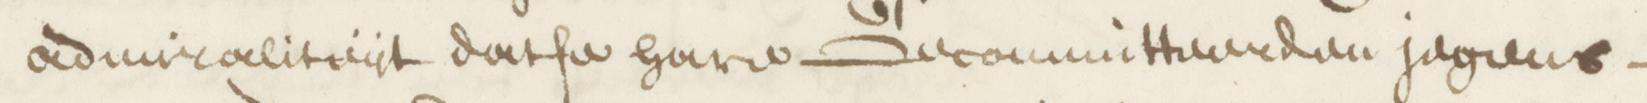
admiraliteijt datse hare Gecommitteerden jegens -
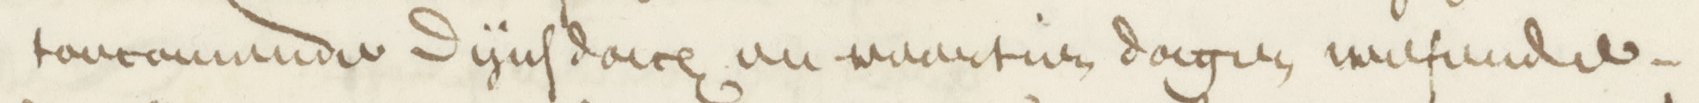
toecomende Dijnsdach en veertien dagen wesende -
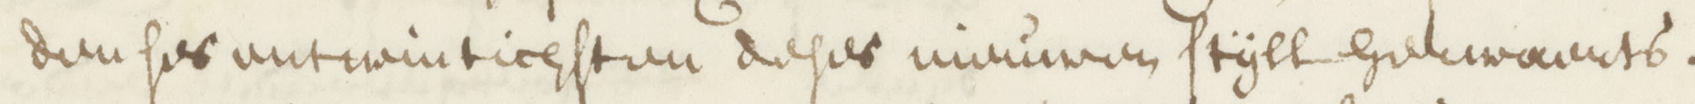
den ses entwintichsten deses nieuwen stijll herwaerts —
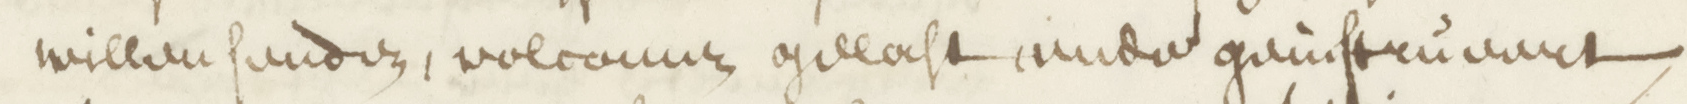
willen senden, volcomen gelast, ende geinstrueert
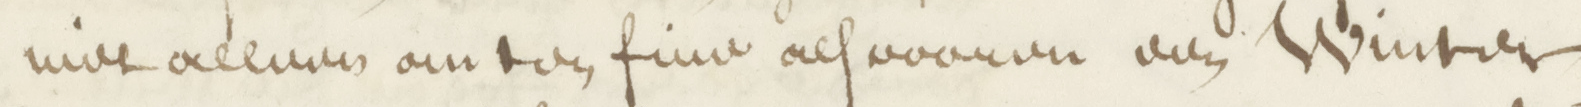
niet alleen om ten fine alsvooren een Winter
